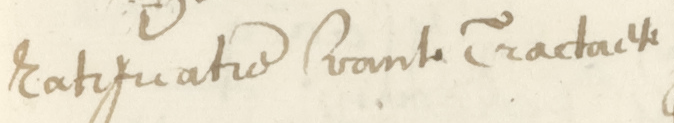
ratificatie vant Tractaet.
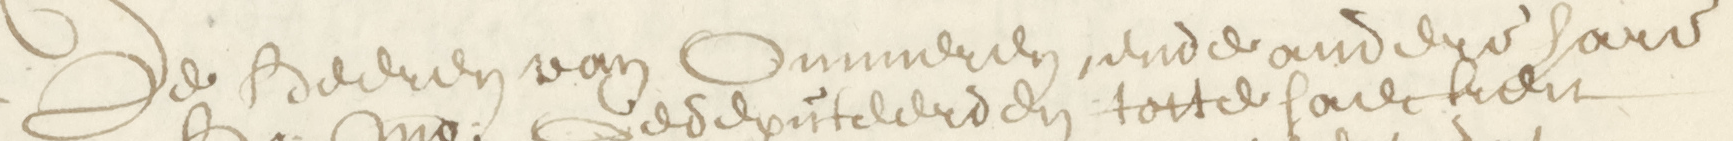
De Heeren van Ommeren ende andere hare
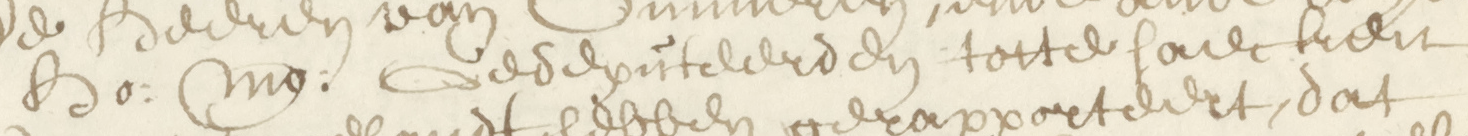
Ho:Mo: Gedeputeerden totte saecken
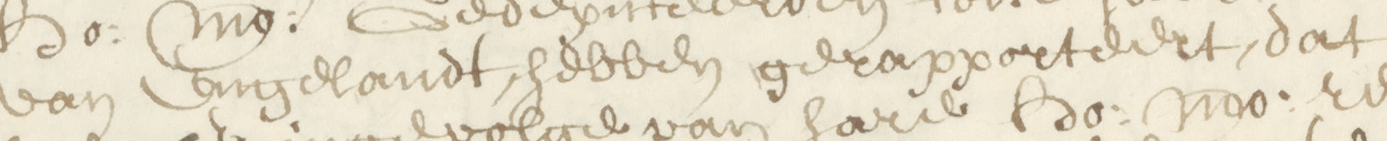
van Engelandt, hebben gerapporteert, dat
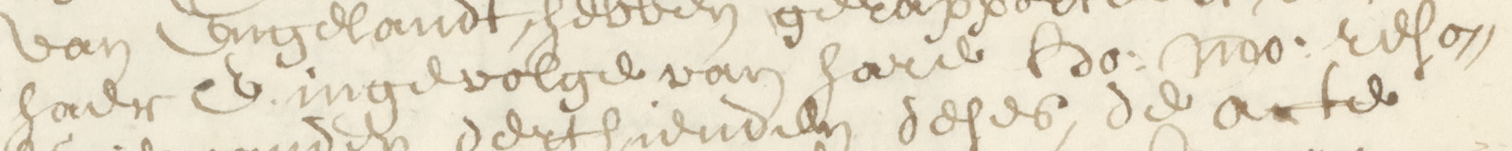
haer E. ingevolge van hare Ho:Mo: reso,,
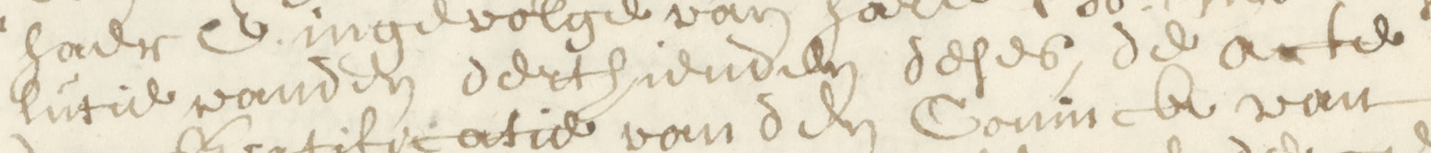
lutie vanden derthienden deses de acte
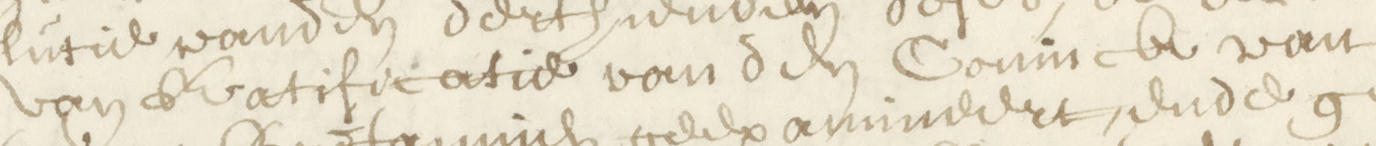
van Ratificatie van den Coninck van
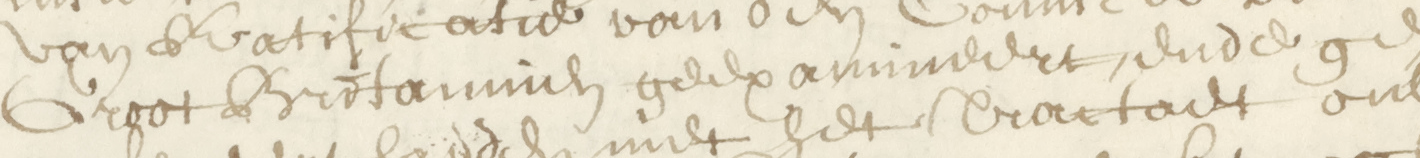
Groot Britannien geexamineert, ende ge„
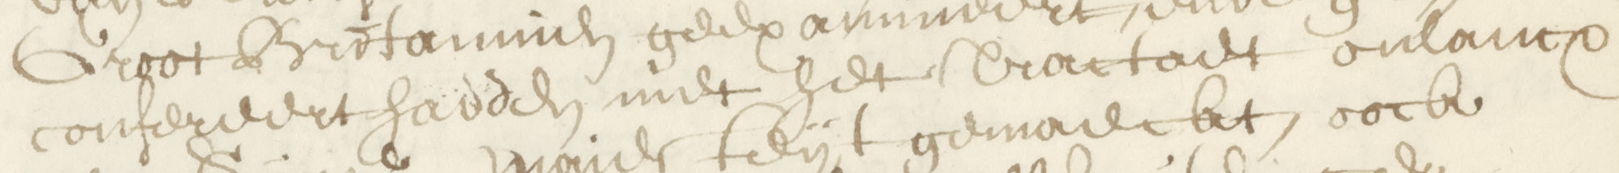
consereert hadden met het Tractaet onlancx
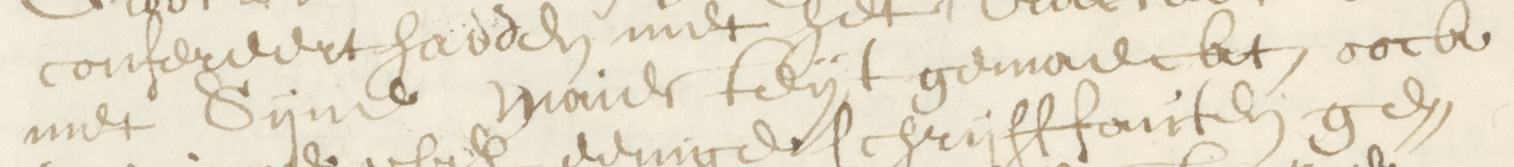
met Sijne maiesteijt gemaeckt, oock
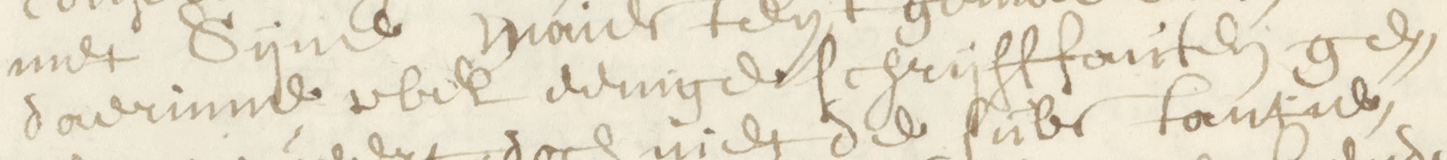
daerinne wel eenige schrijfffouten ge„
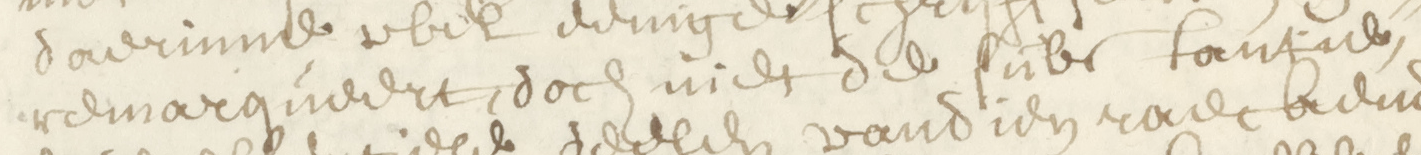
remarqueert, doch niet de substantie,
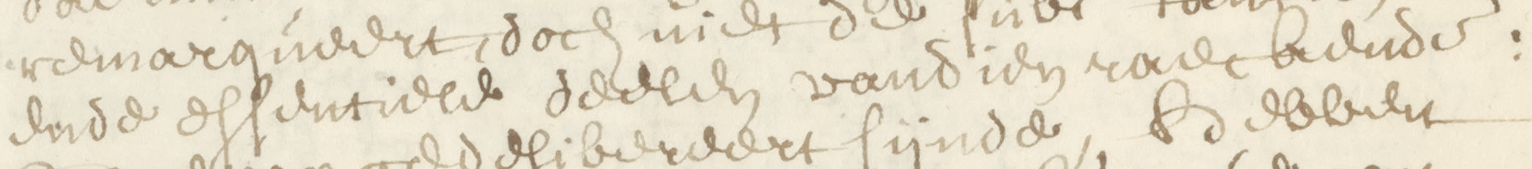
ende essentiele deelen vandien raeckende:
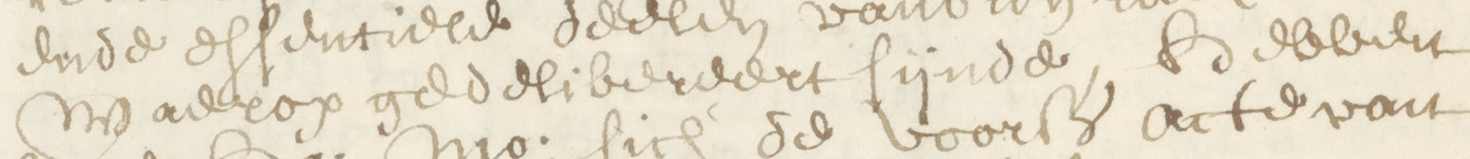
Waerop gedelibereert sijnde, hebben
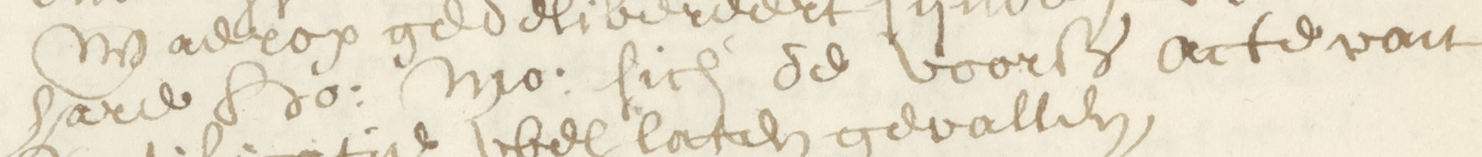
hare Ho:Mo: sich de voors. acte van
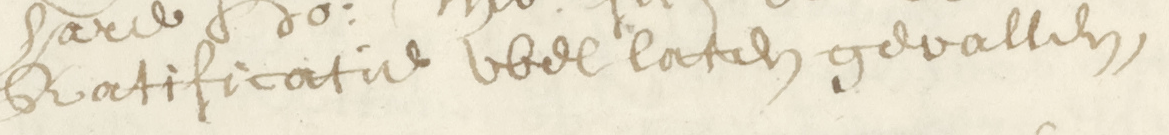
Ratificatie wel laten gevallen.
